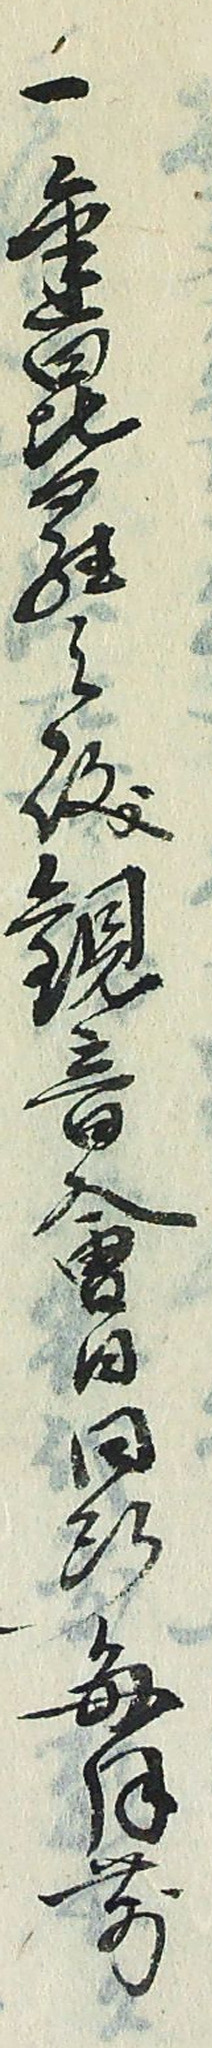一金毘羅之儀観音會日同断毎月前
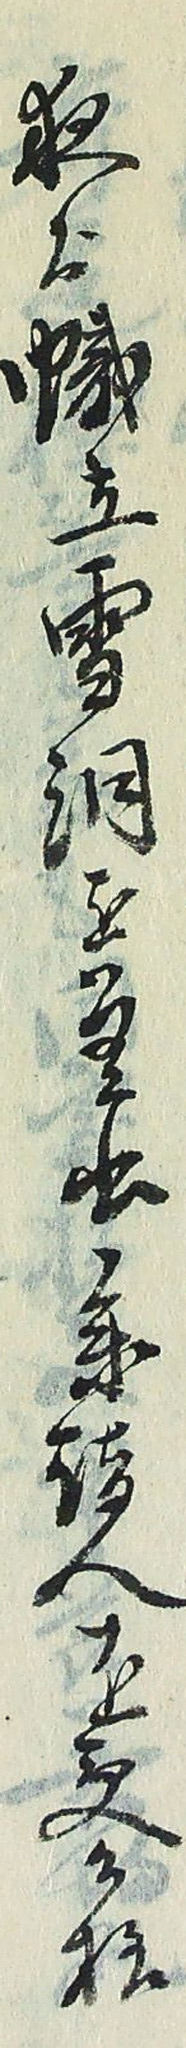夜ゟ幟立雪洞を差出参詣人を受候様
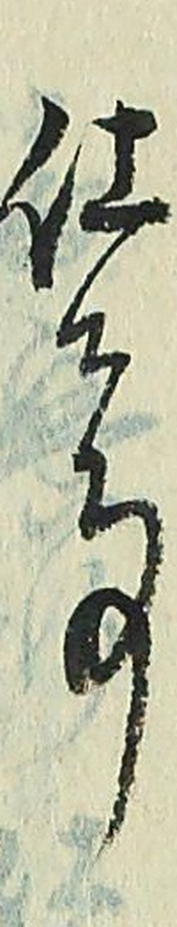仕候事
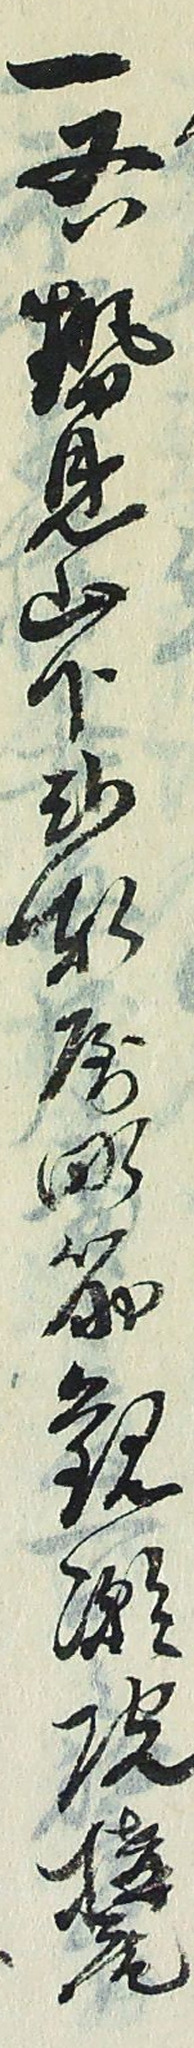一右勢見山下弐軒屋町筋観潮院構庵
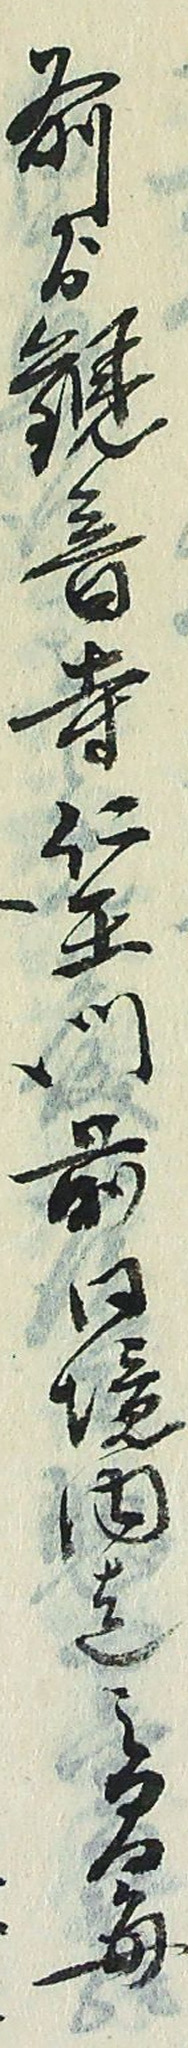前ゟ観音寺仁王川前同境内迄之間毎
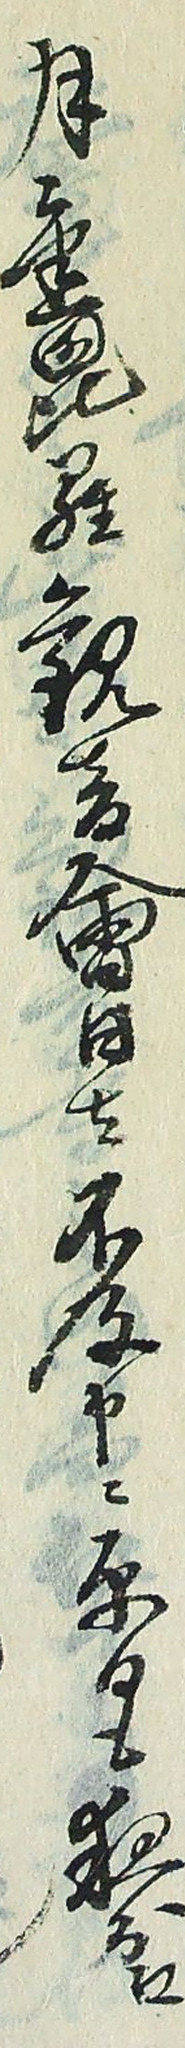月金毘羅観音會日者不及申ニ平日も夜分江
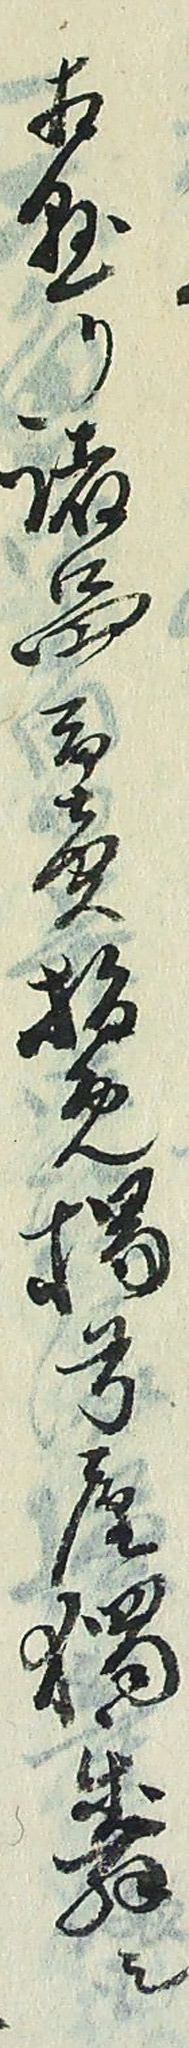相懸り諸品市賣指免楊弓屋獨楽舞シ
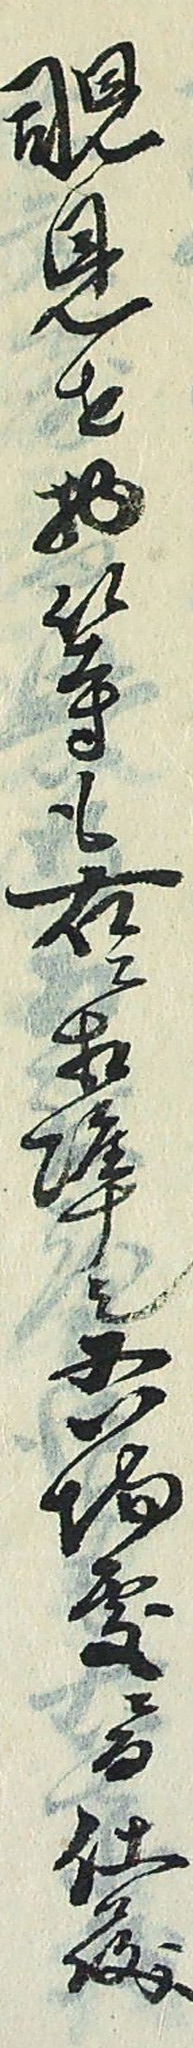覗見せ物等も右ニ相準シ右場處ニ而仕候儀
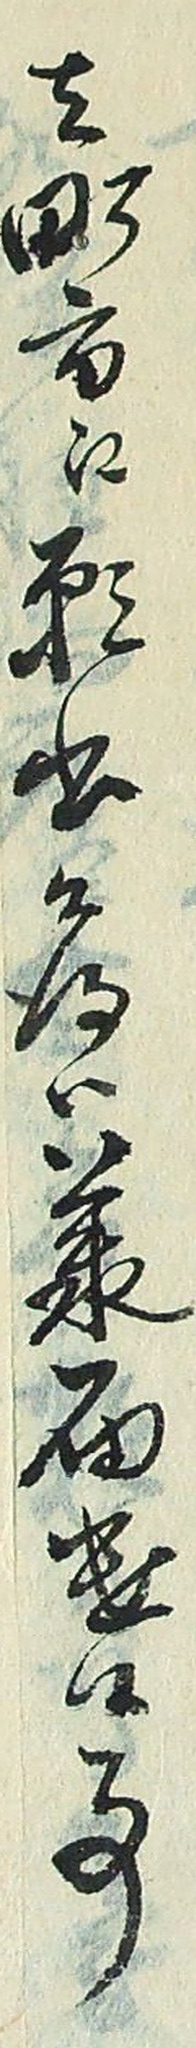者町方江願出候得ハ承届遣候事
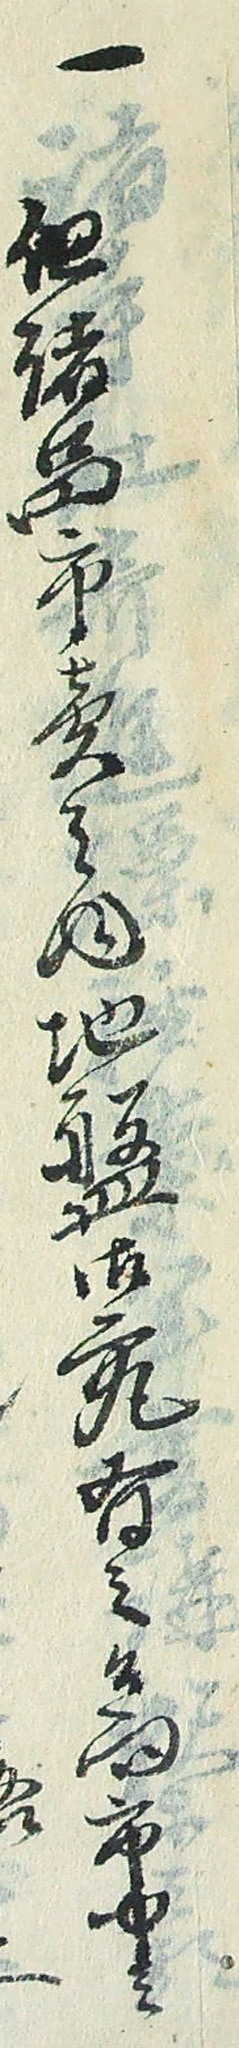但諸品市賣之内地盤御究有之候向市中之
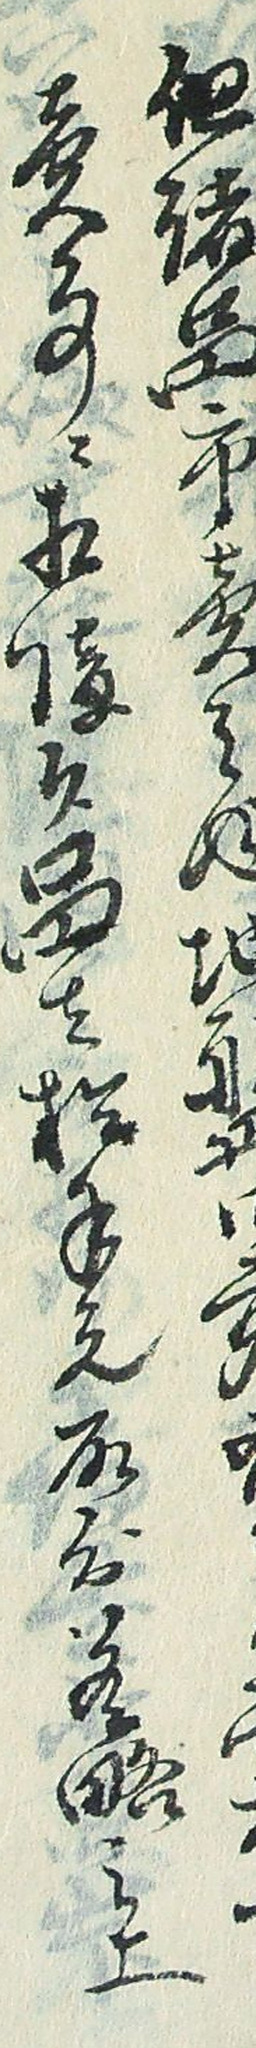賣事ニ相障候品者於手元取分差略之上
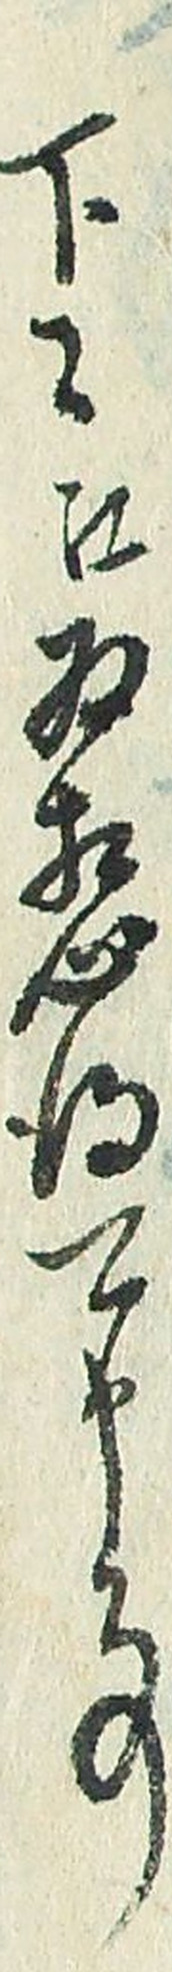下々江為相心得可申事

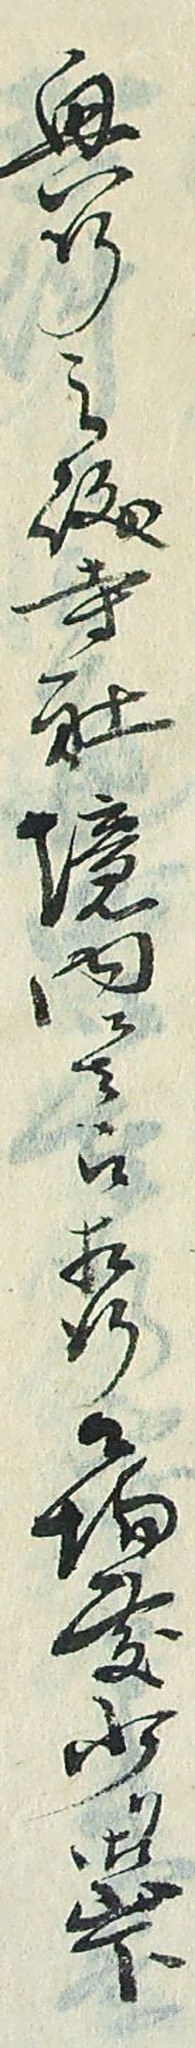興行之儀寺社境内ニ者被相行候場處少ク御山下双

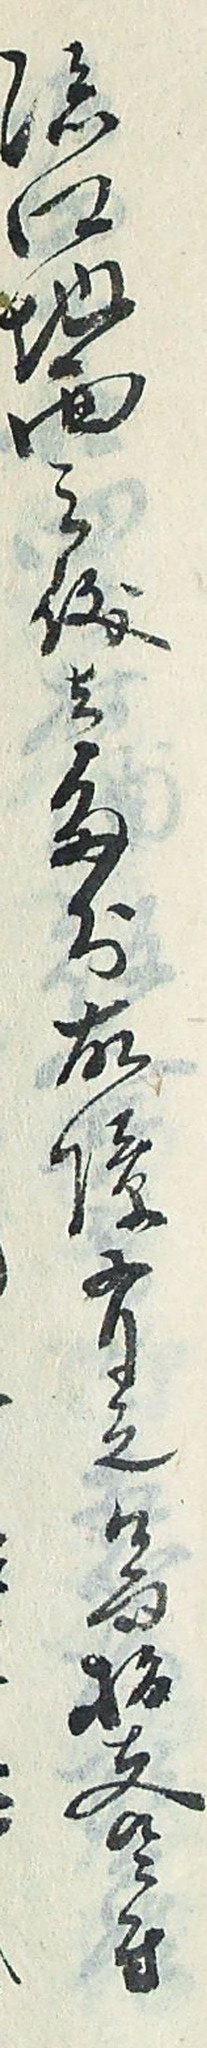諸郷地面之儀者多分故障有之候而指支候ニ付
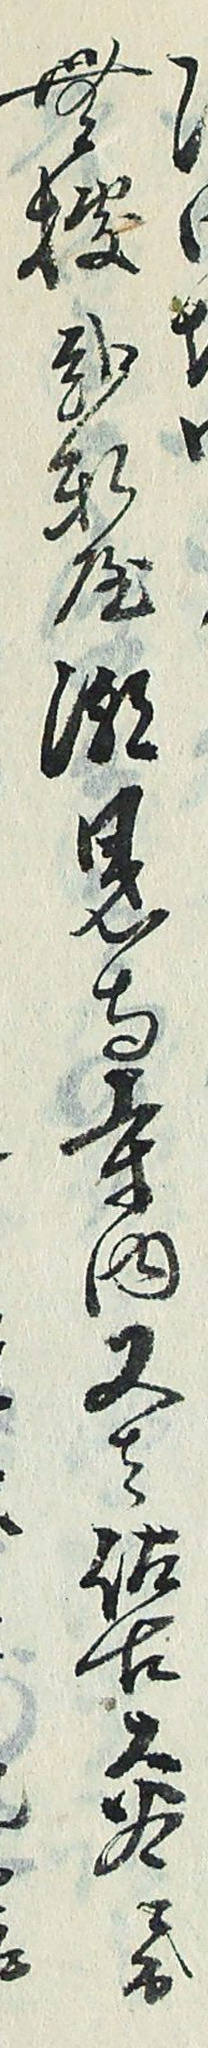無據弐軒屋潮見寺寺内又者佐古大谷ニ而
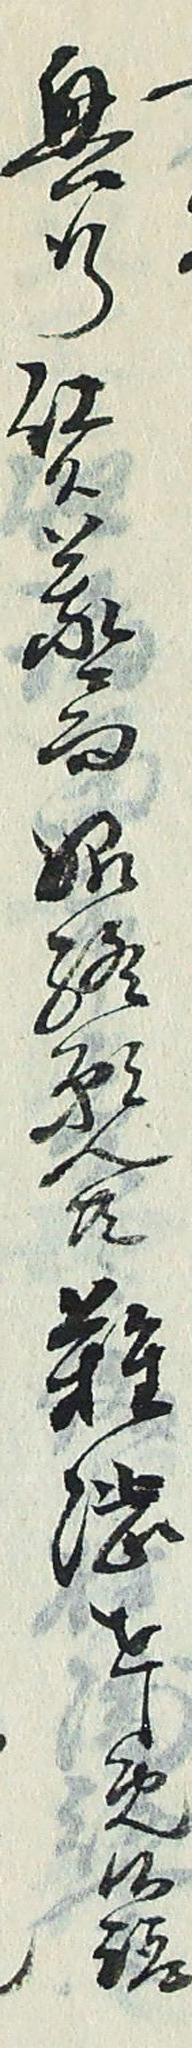興行仕候義ニ而終始願人共難渋せしめ候趣
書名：諸御趣意書并御下知向之写
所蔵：鳴門教育大学 Naruto University of Education
